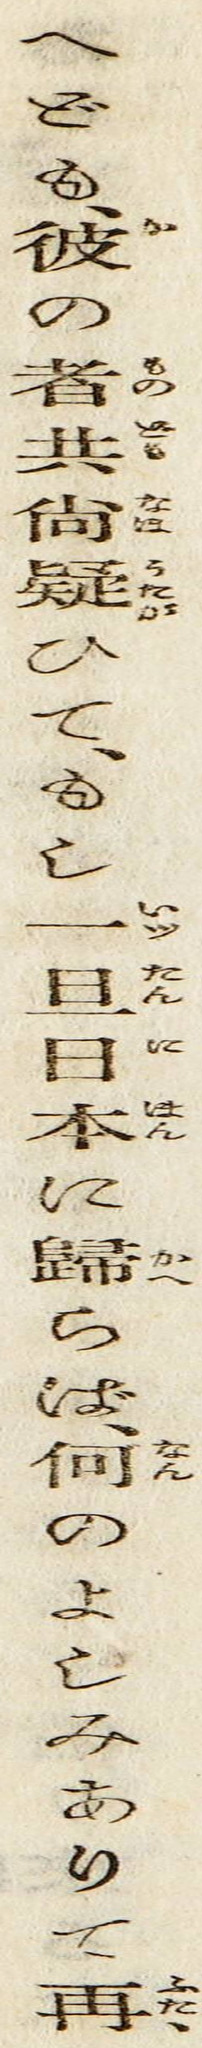へども、彼の者共尚疑ひて、もし一旦日本に帰らば、何のよしみありて再
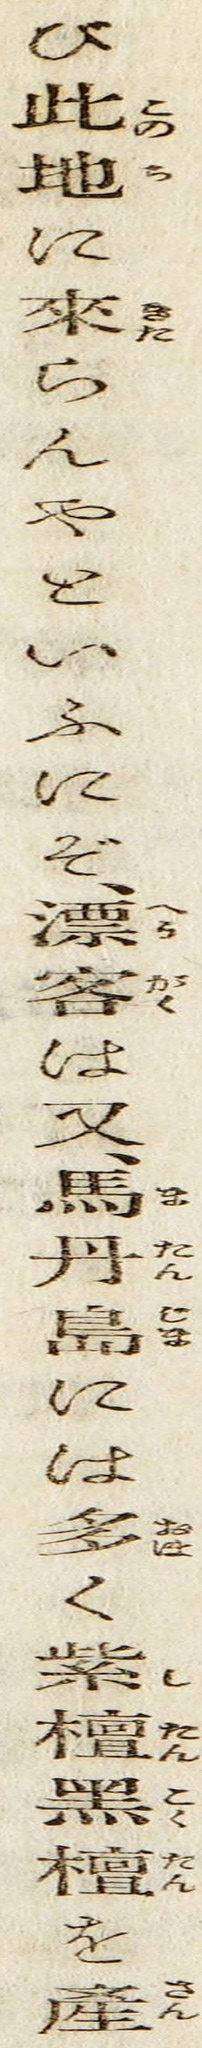び此地に来らんやといふにぞ、漂客は又、馬丹島には多く紫檀黒檀を産
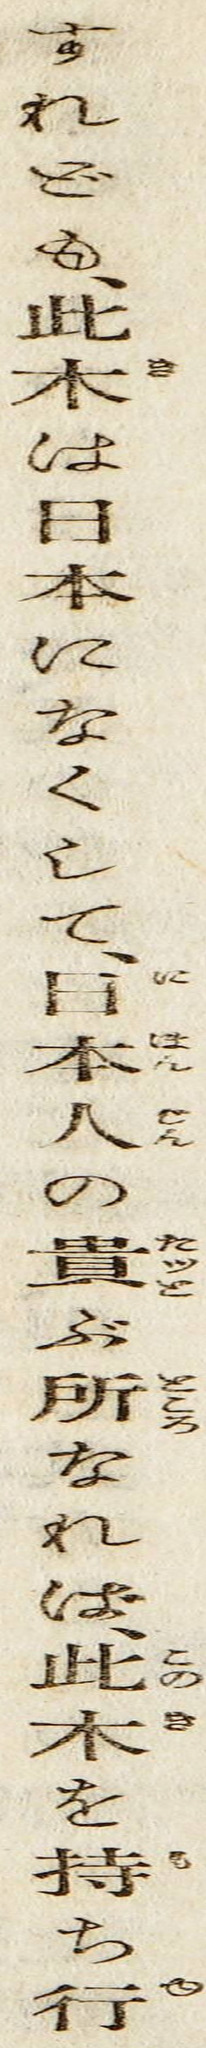すれども、此木は日本になくして、日本人の貴ぶ所なれば、此木を持ち行
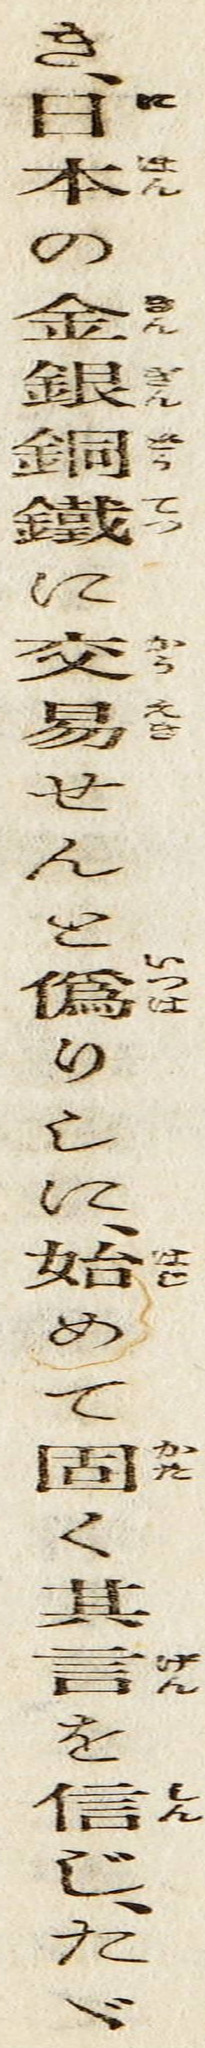き、日本の金銀銅鉄に交易せんと偽りしに、始めて固く其言を信じ、たヾ
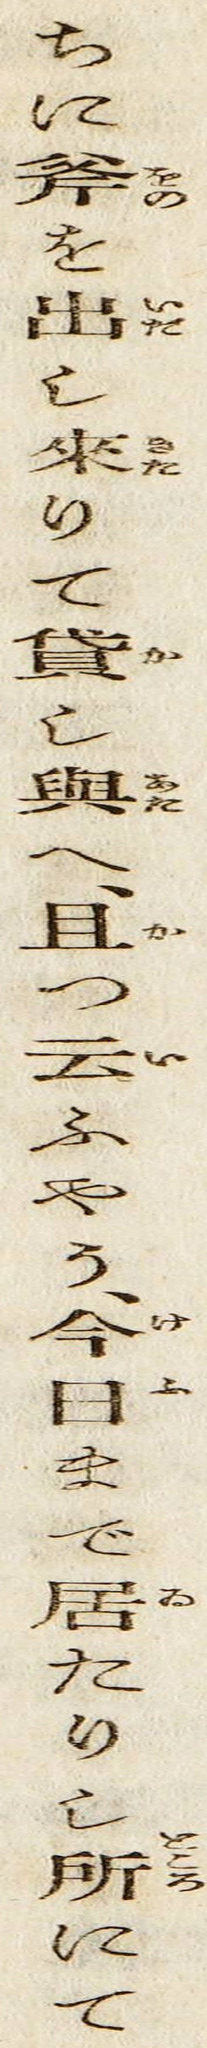ちに斧を出し来りて貸し与へ、且つ云ふやう、今日まで居たりし所にて
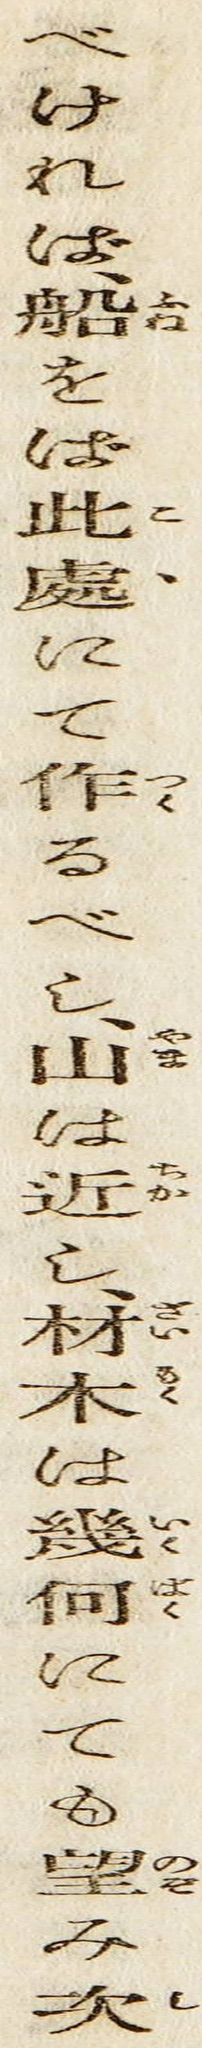べければ、船をば此処にて作るべし、山は近し、材木は幾何にても望み次
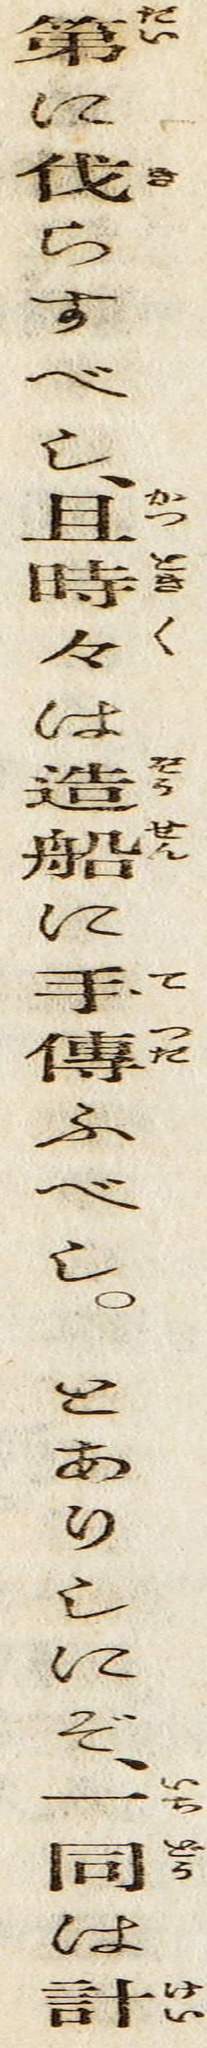第に伐らすべし、且時々は造船に手伝ふべし。とありしにぞ、一同は計
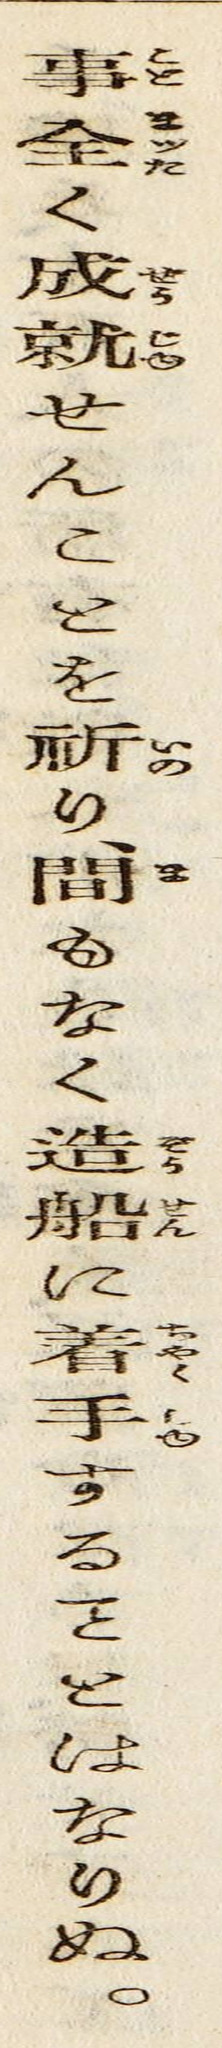事全く成就せんことを祈り、間もなく造船に着手することとはなりぬ。
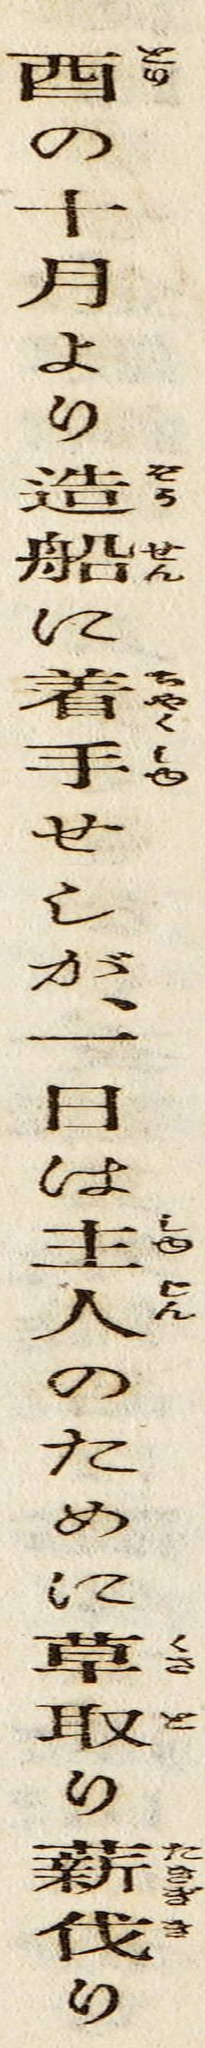酉の十月より造船に着手せしが、一日は主人のために草取り薪伐り
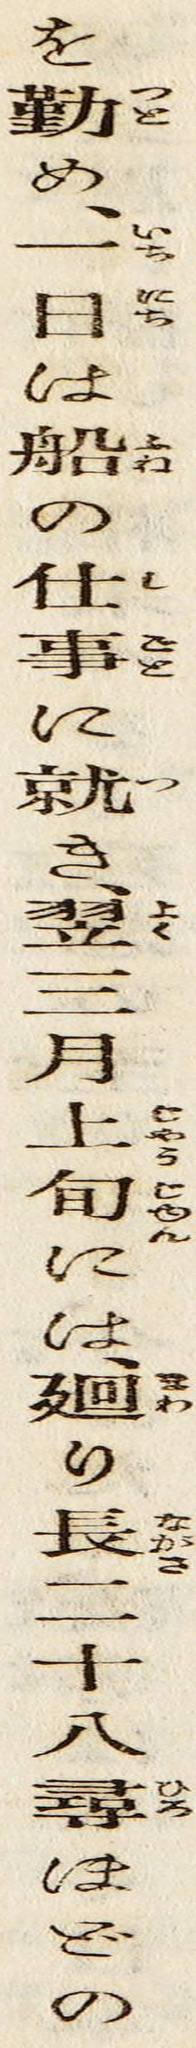を勤め、一日は船の仕事に就き、翌三月上旬には、廻り長二十八尋ほどの
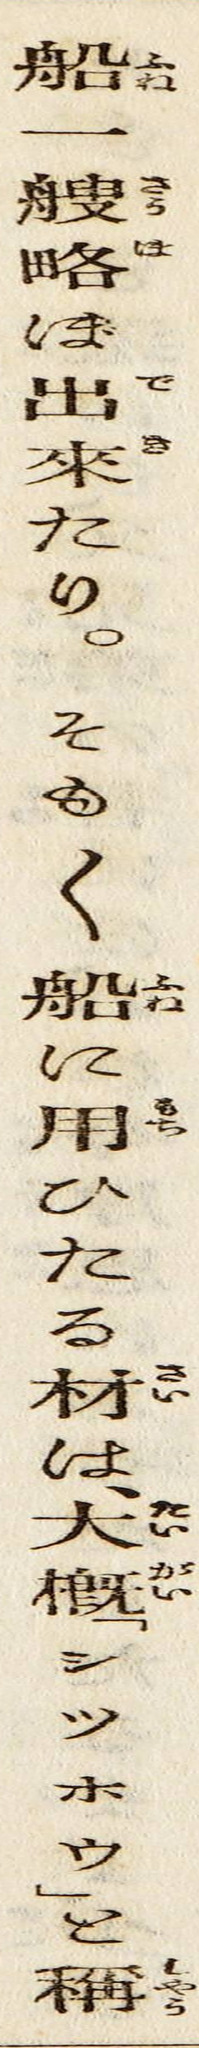船一艘略ぼ出来たり。そも〳〵船に用ひたる材は、大概「シツホウ」と称
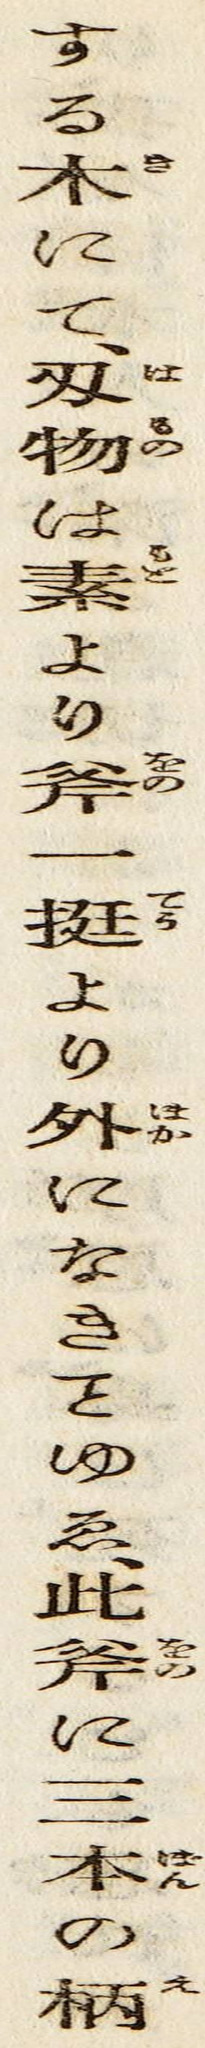する木にて、刃物は素より斧一挺より外になきことゆゑ、此斧に三本の柄
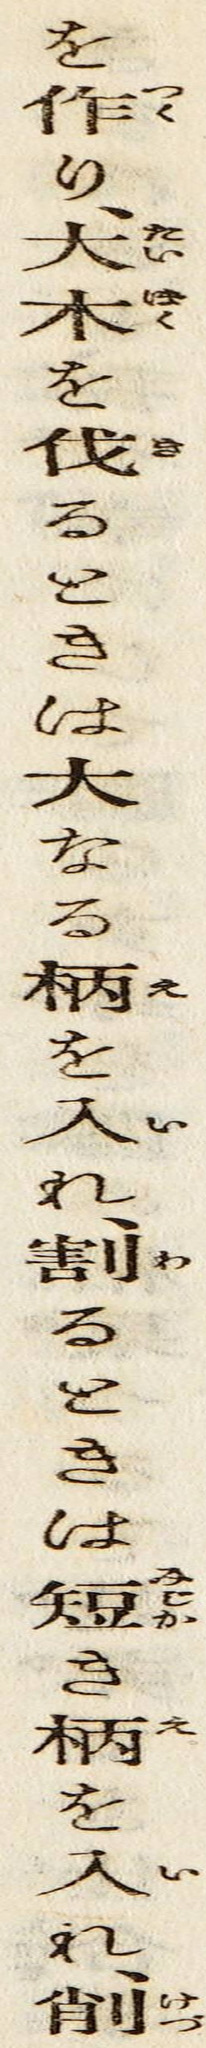を作り、大木を伐るときは大なる柄を入れ、割るときは短き柄を入れ、削
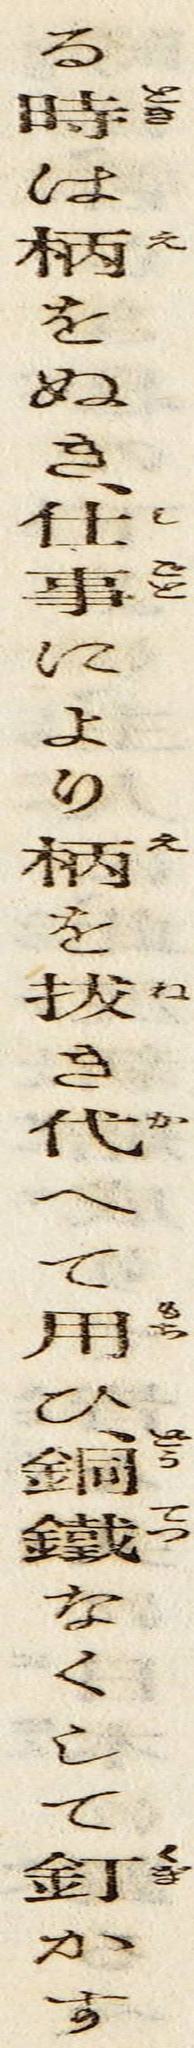る時は柄をぬき、仕事により柄を抜ねき代へて用ひ、銅鉄なくして釘かす
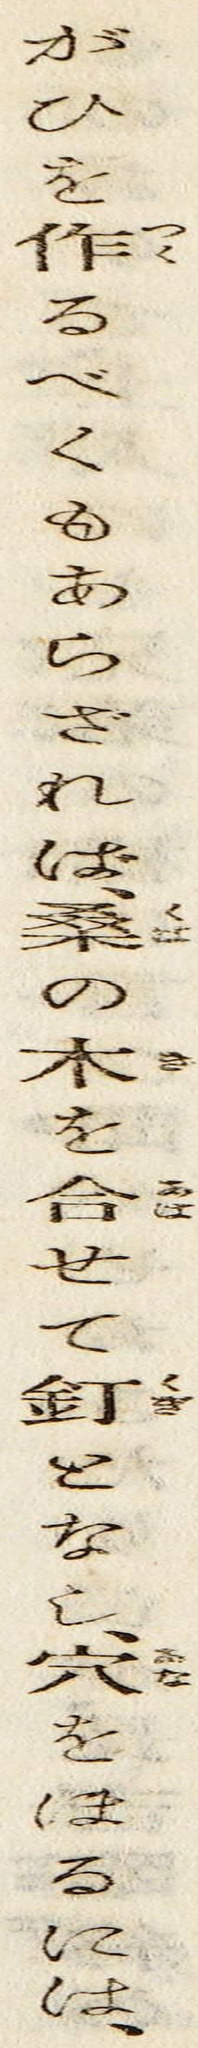がひを作るべくもあらざれば、桑の木を合せて釘となし、穴をほるには、
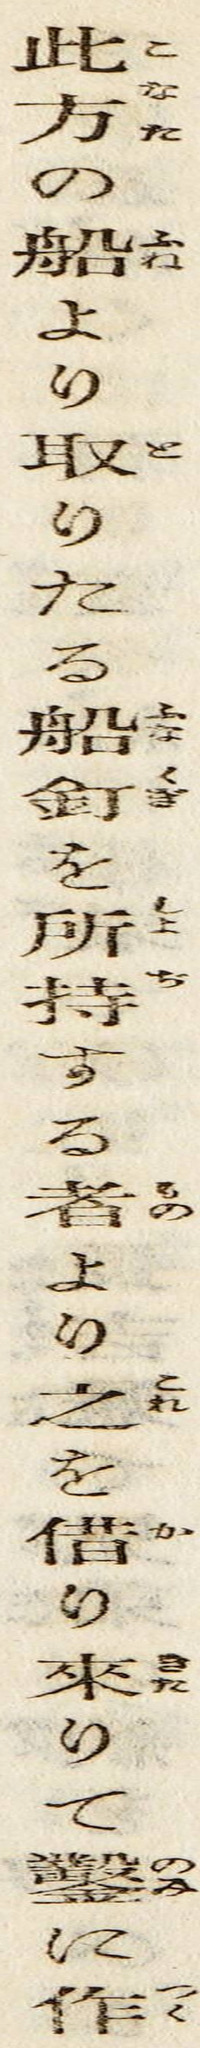此方の船より取りたる船釘を所持する者より之を借り来りて鑿に作
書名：日本漂流譚
